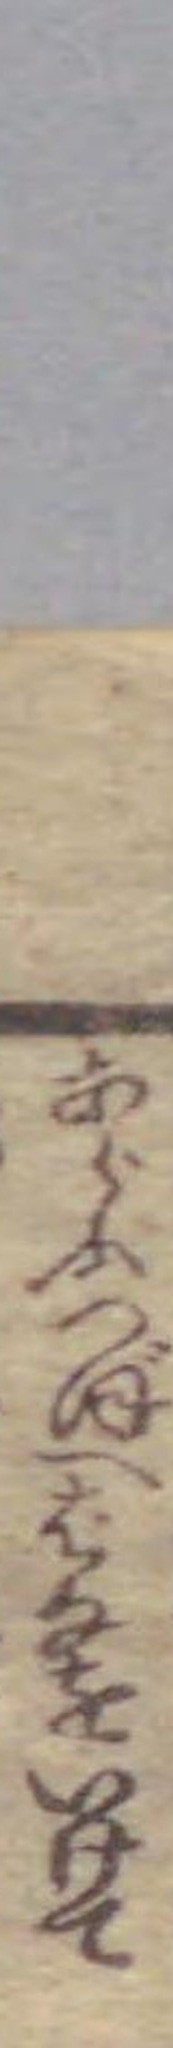あらふつぼへはなをいけて
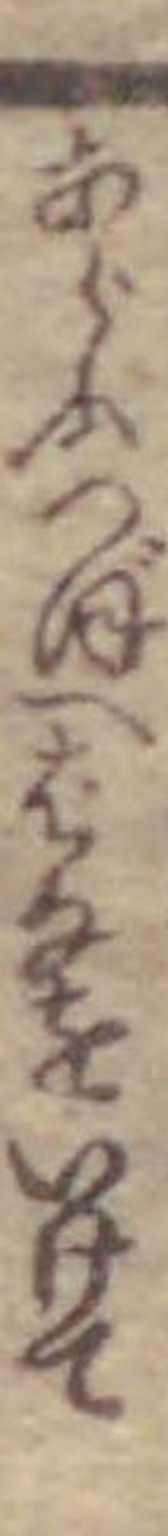あらふつぼへはなをいけて
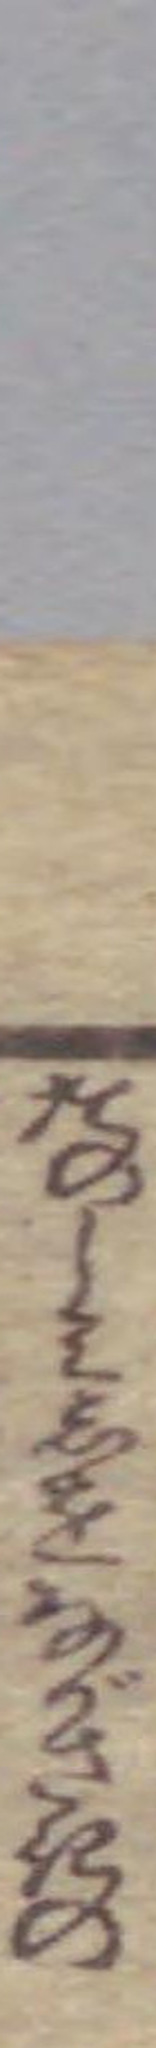たのしみしをながさきの
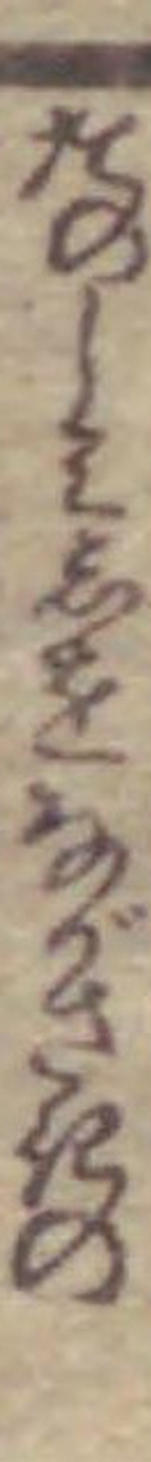たのしみしをながさきの
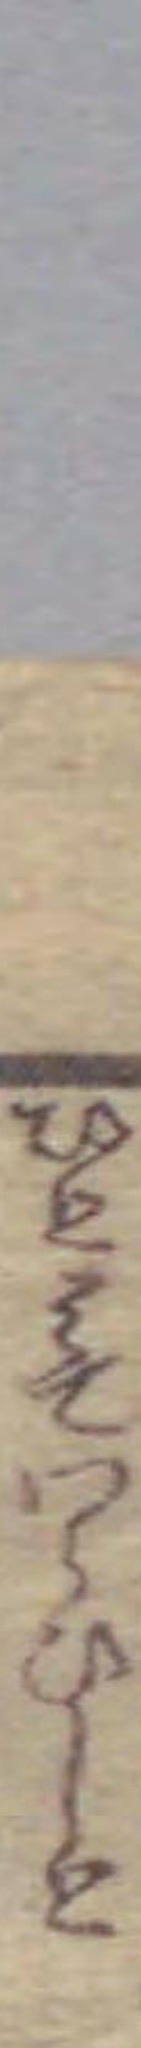ひとみてわらひしと
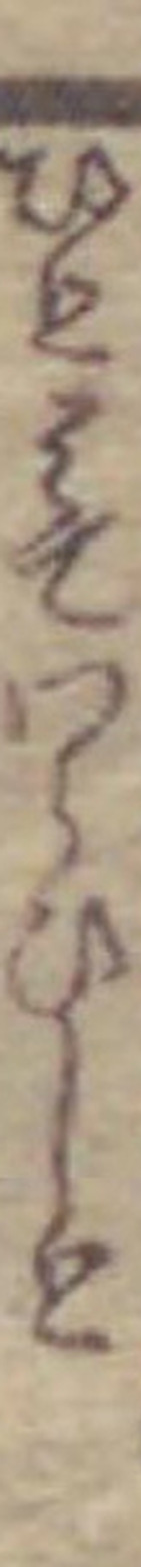ひとみてわらひしと
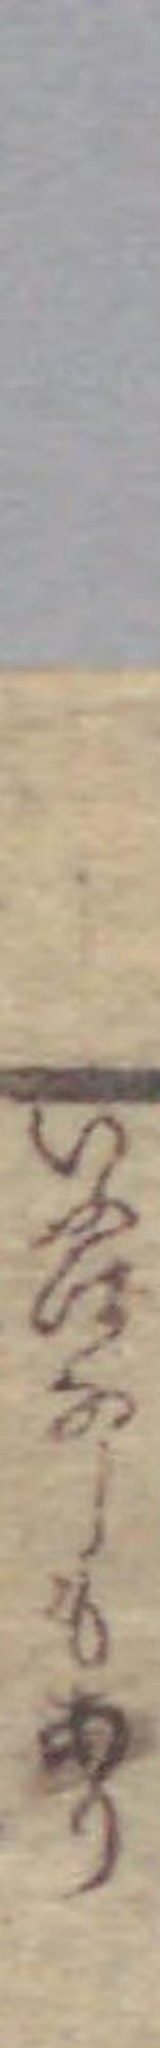いふはなしもあり
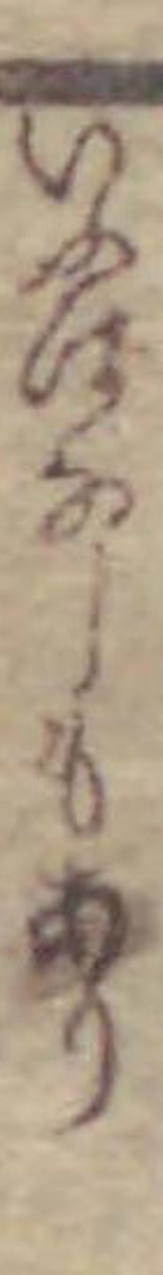いふはなしもあり
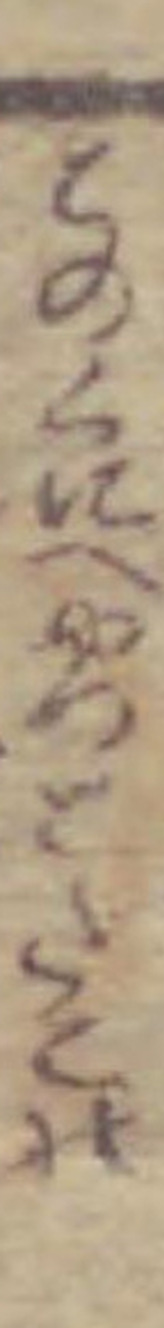このくにへやつこたこの
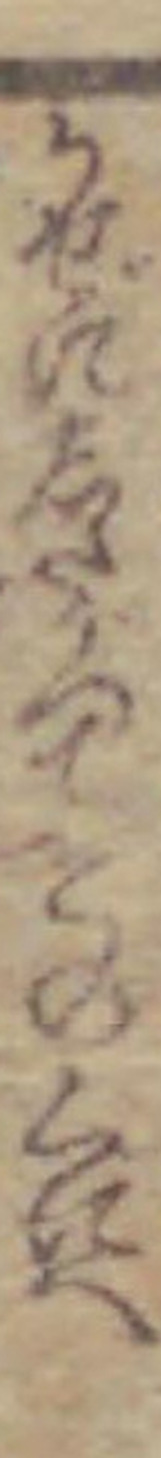かぜにしたがつてこのくにへ
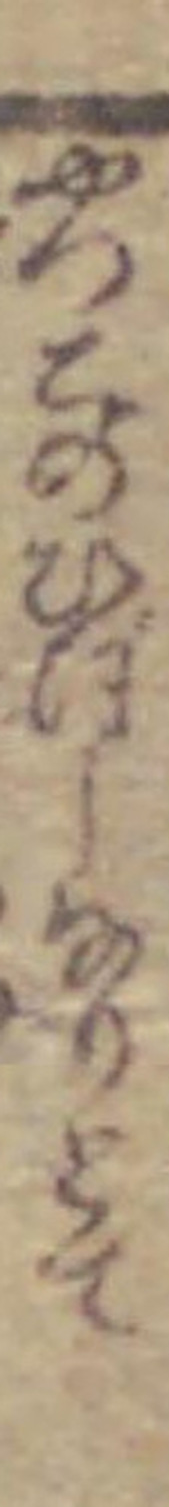やつこのひぼしなりとて
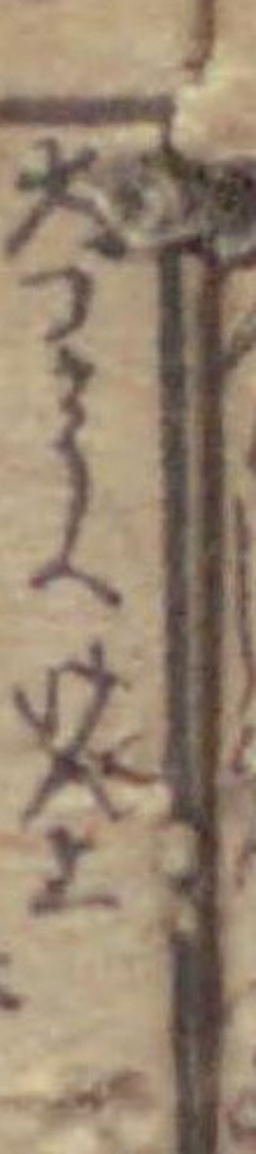大わうへけん上
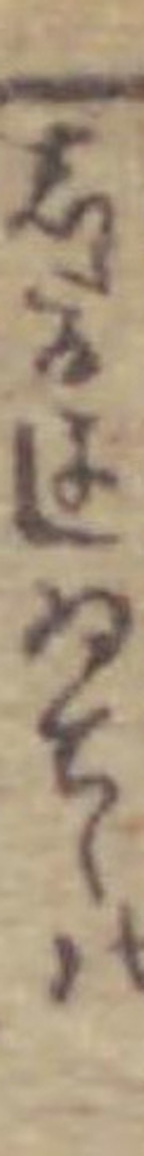したるよしゐこくの
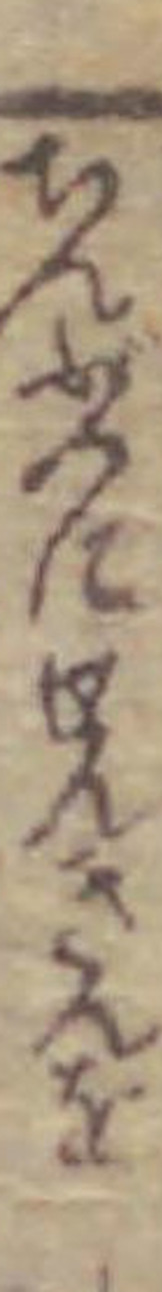ちんぶつにせんきんを
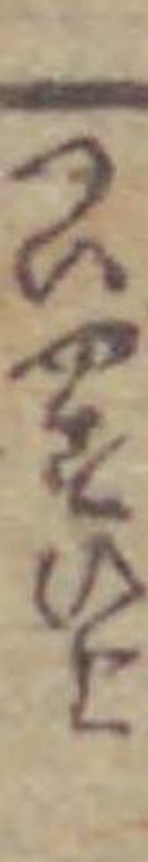ついやすひと
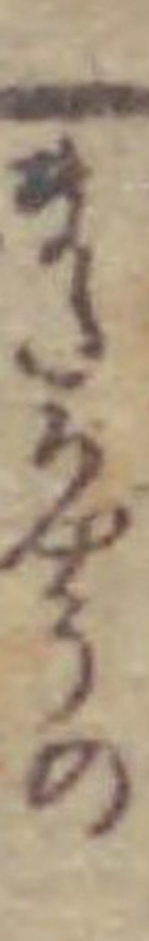またかやうの
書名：化物和本草 : 3巻
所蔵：国立国会図書館 National Diet Library, JAPAN
